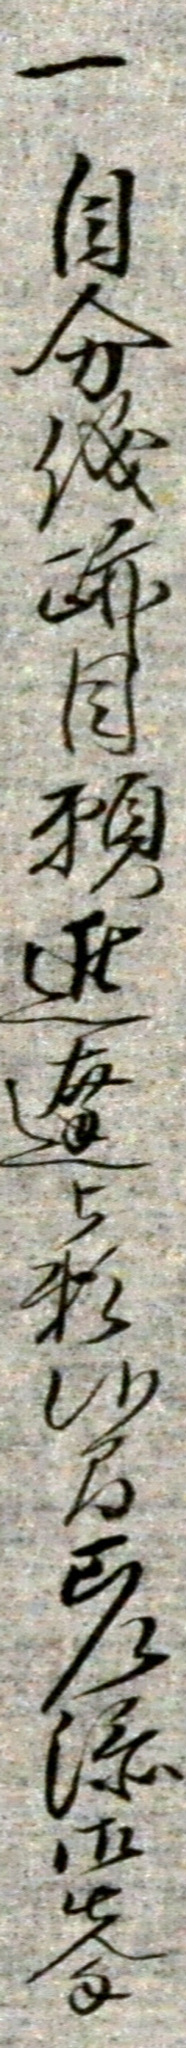一自分儀跡目願進達と頼候間差添御先手
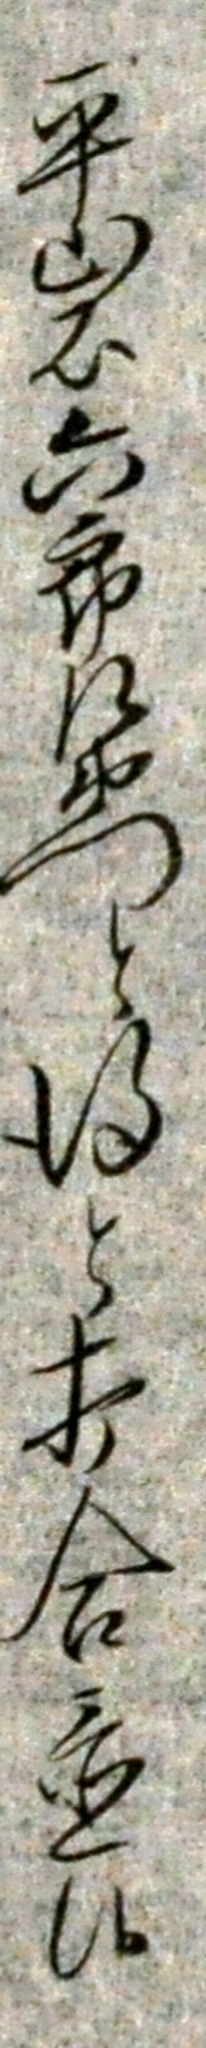平岩六郎左衛門と得と打合置候
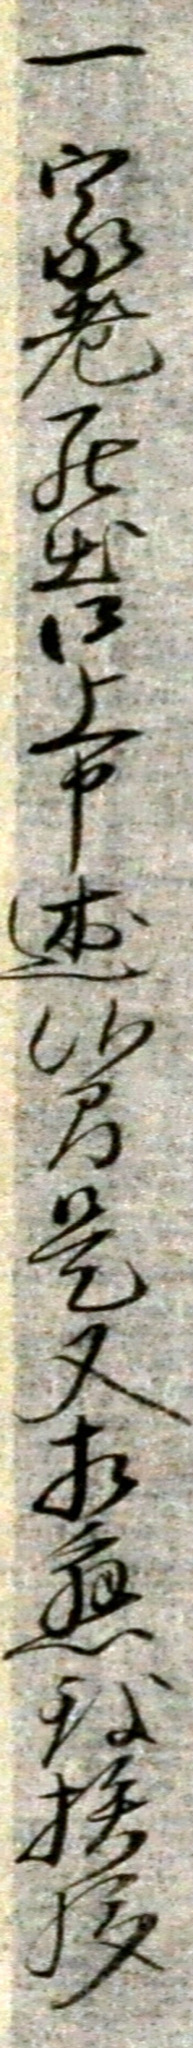一家老罷出口上申述候間是又相応致挨拶
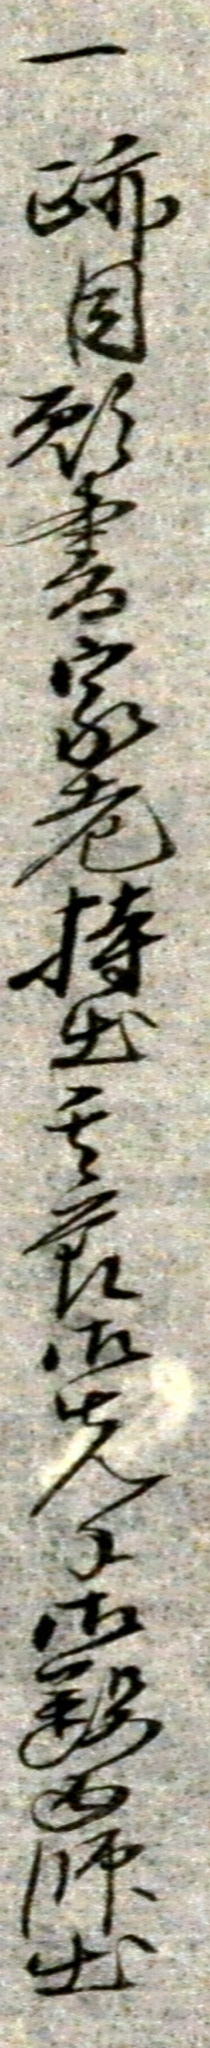一跡目願書家老持出其節御先手御醫師出
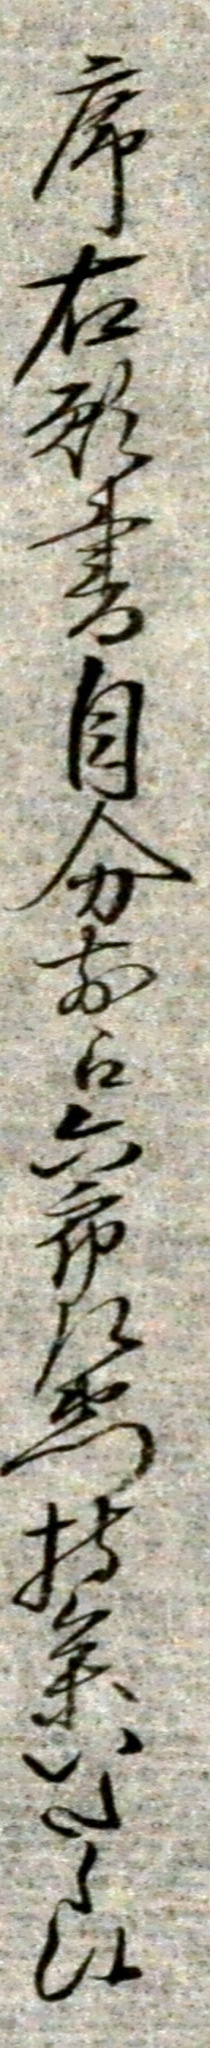席右願書自分前え六郎左衛門持参いたし候
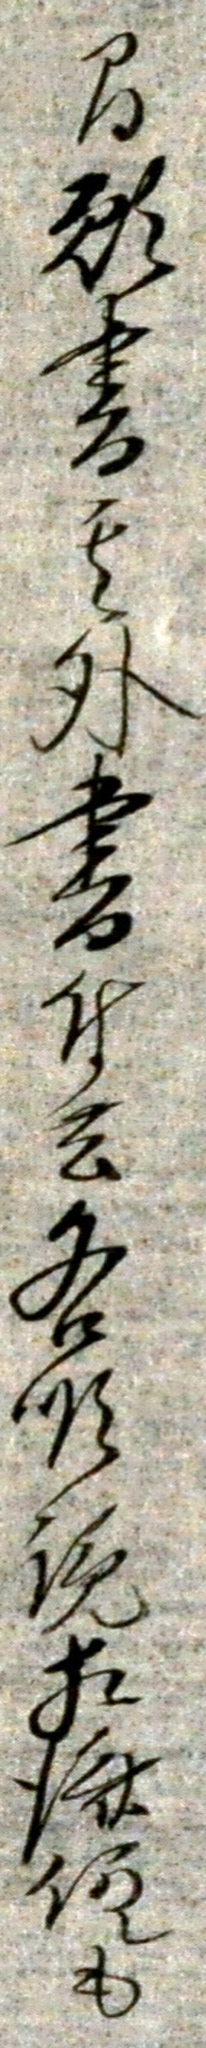間願書其外書付は各順覧相済何レも
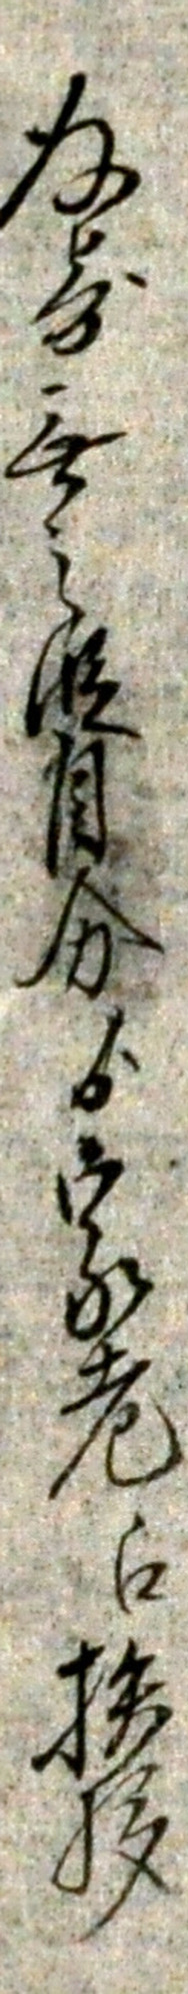存寄無之段自分ゟ家老え挨拶
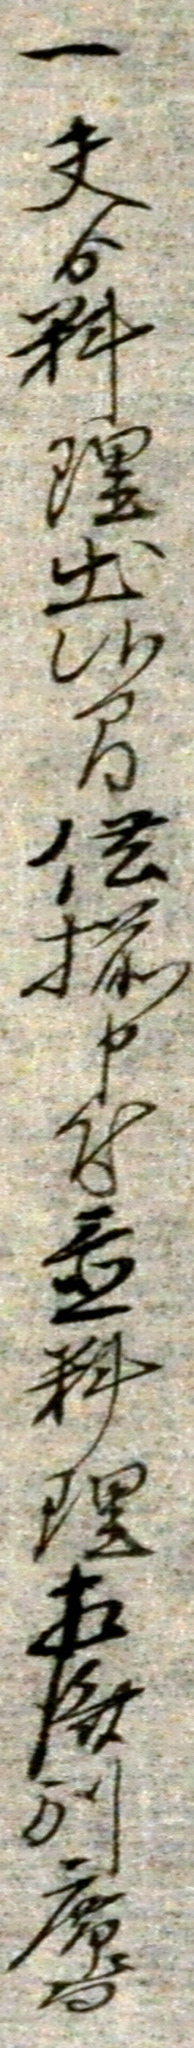一夫ゟ料理出候間供揃申付置料理相済別席ニ而
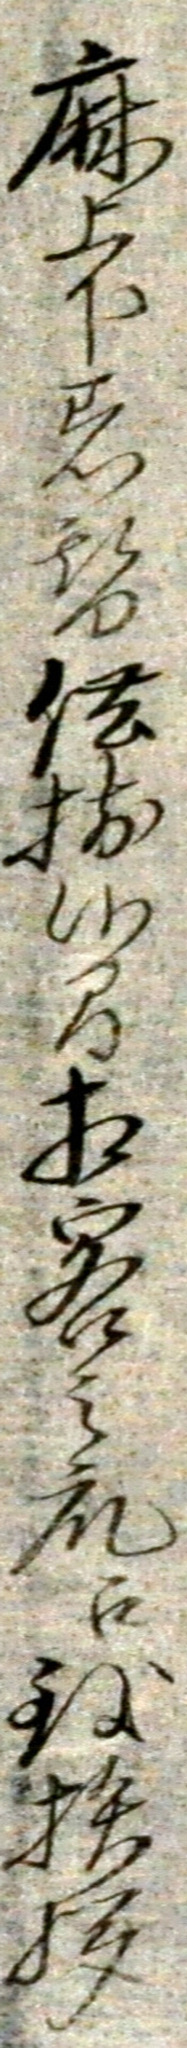麻上下着替供揃候間相客之衆え致挨拶
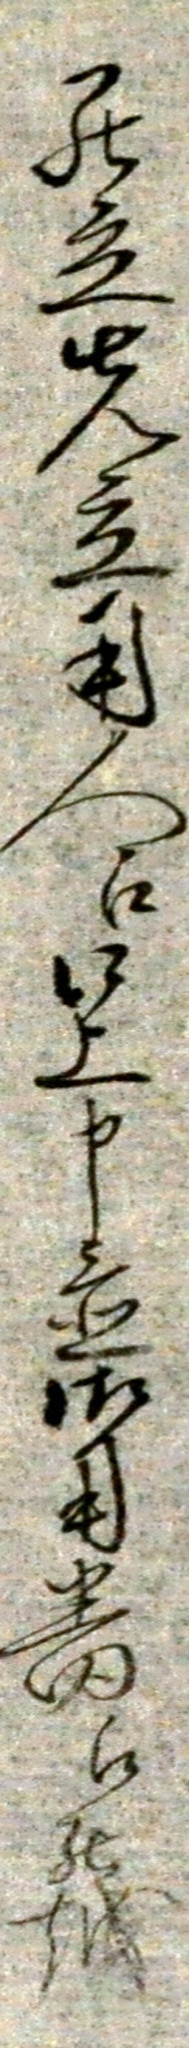罷立先立用人え口上申置御用番え罷越
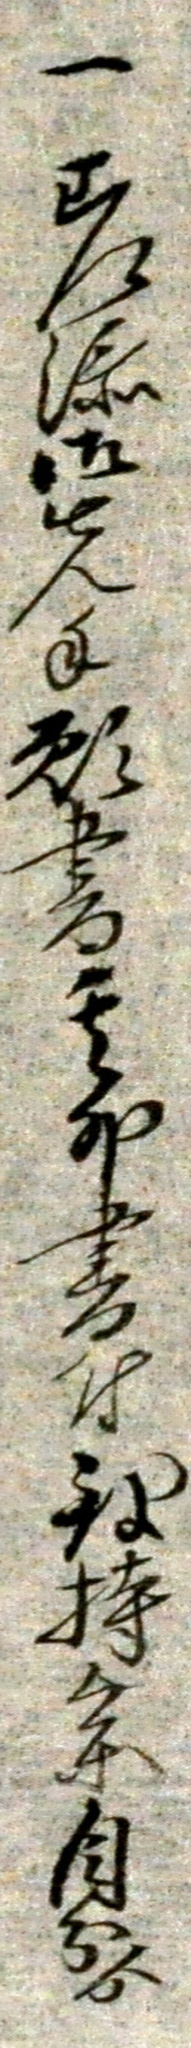一差添御先手願書其外書付致持参自分ゟ
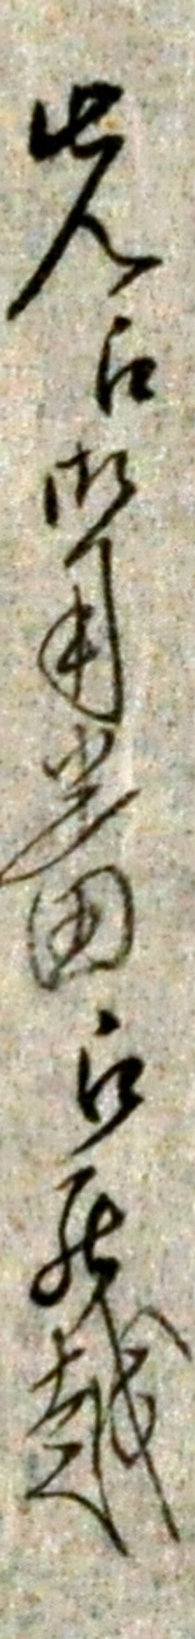先え御用番え罷越
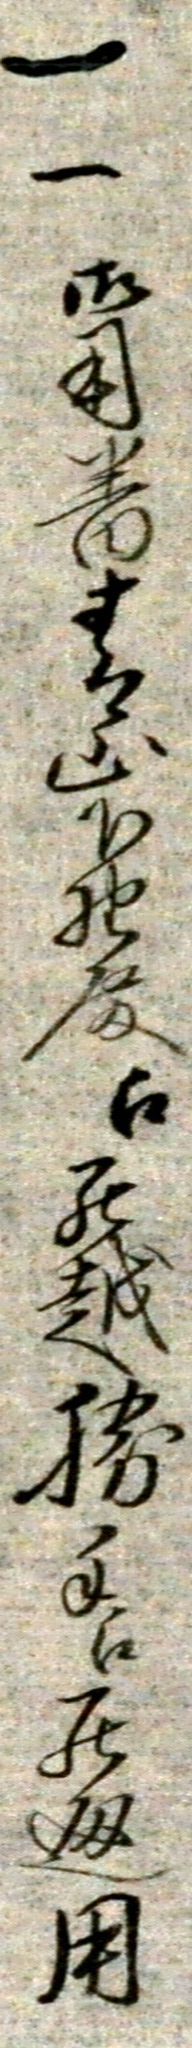一御用番青山下野殿え罷越勝手え罷通用
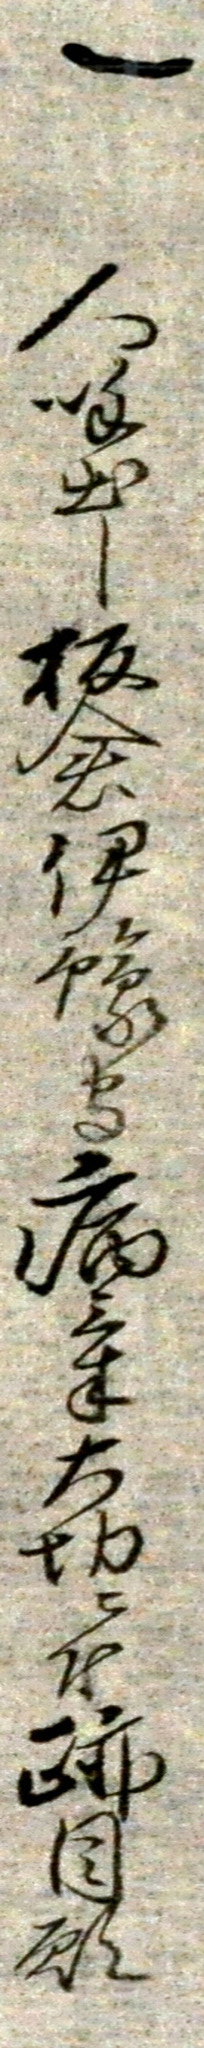人呼出し板倉伊豫守病気大切ニ付跡目願
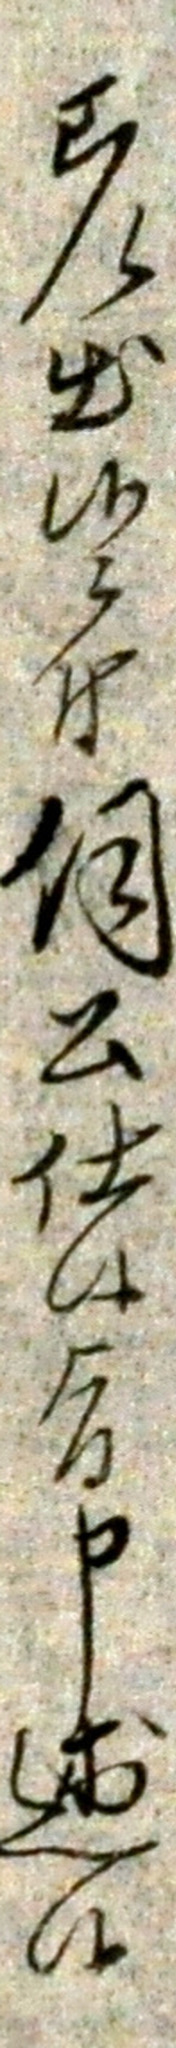差出候ニ付伺公仕候旨申述候

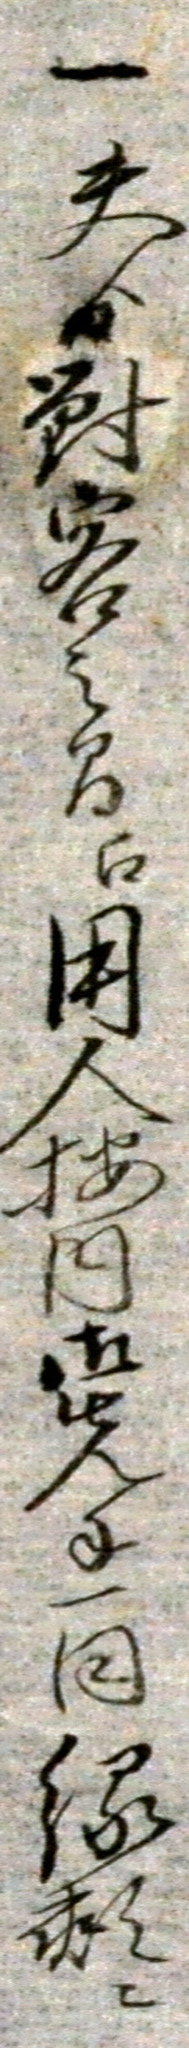一夫ゟ対客之間え用人按内御先手一同縁頬ニ
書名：諸名代相勤候節ノ留書外
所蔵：伊那市立高遠町図書館・合同会社AMANE
